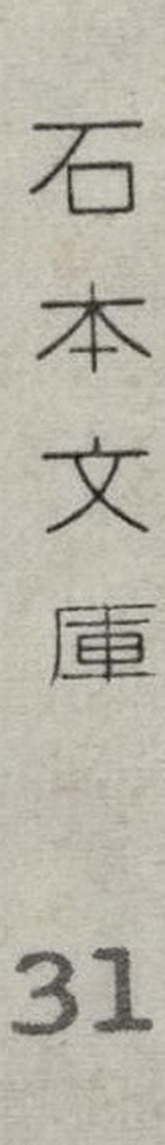石本文庫
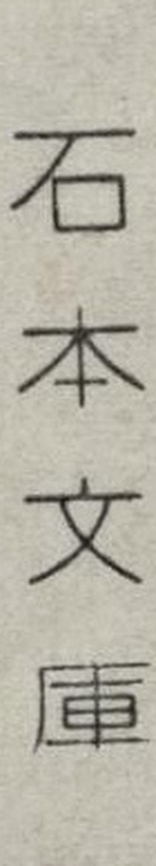石本文庫

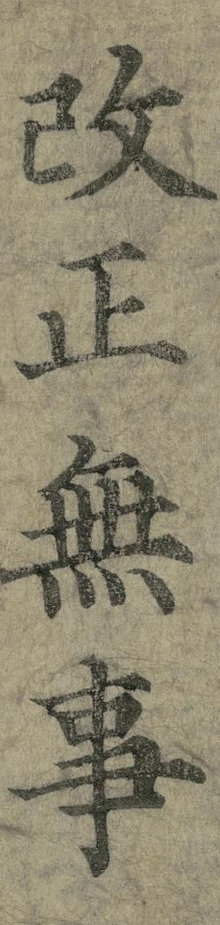改正無事
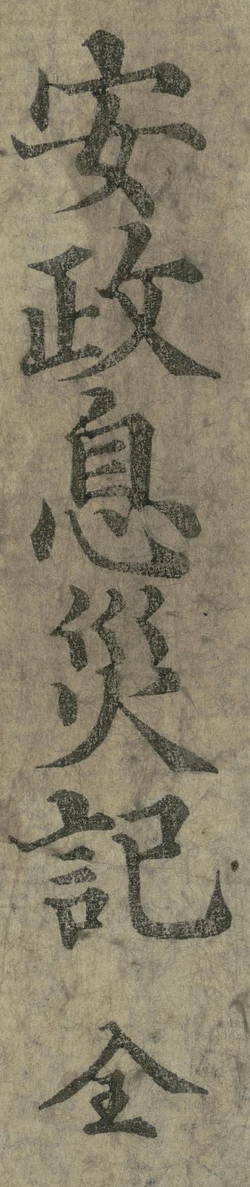安政息災記全
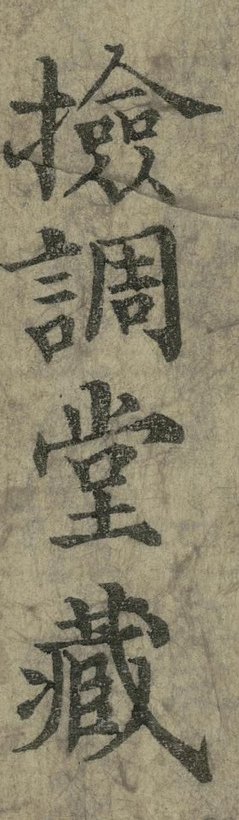撿調堂藏

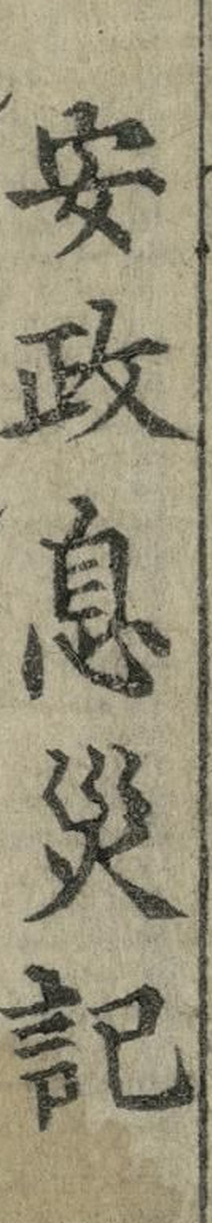安政息災記
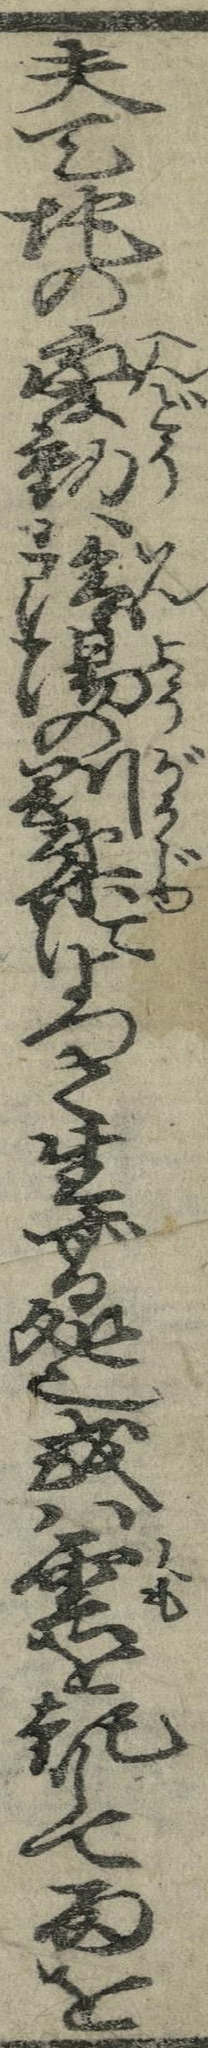夫天地の変動は陰陽の剛柔によつて生ずる処也或は雲を起して雨を
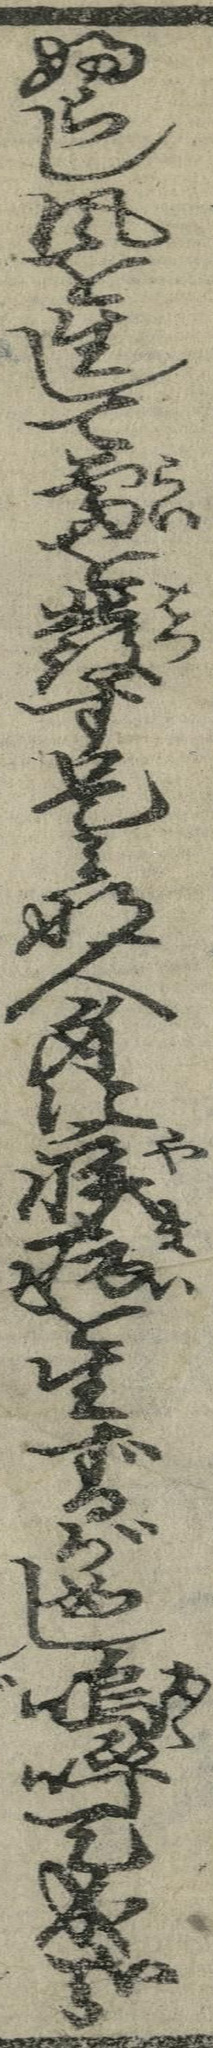ふらし風を生して雷を発す是みな人身に疾病を生ずるが如し嗚呼天成哉
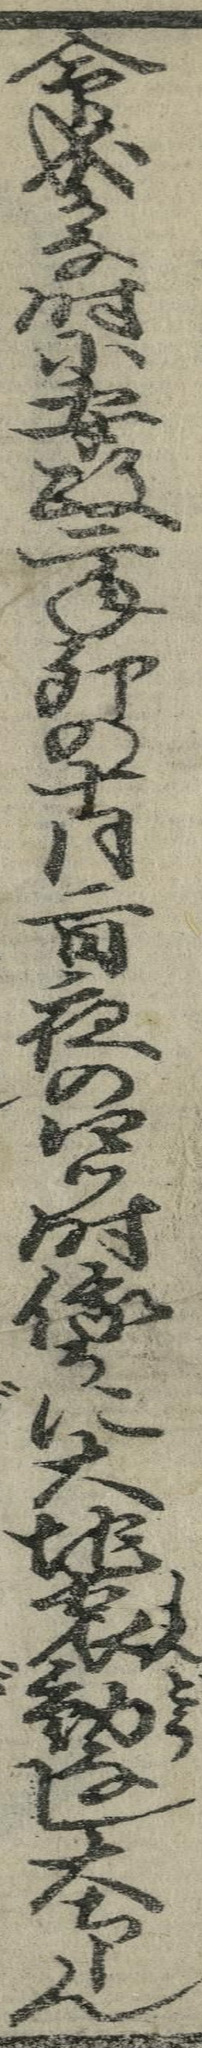命成かな時に安政二年卯の十月二日夜の四ツ時俄かに大地震動なし大ちしん
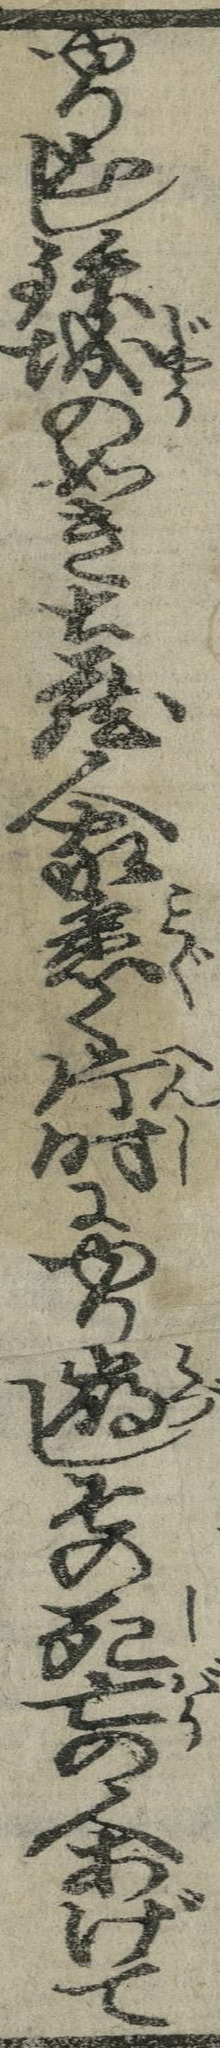ゆり出し鉄城の如き土蔵人家悉く片時にゆり崩しその死亡の人あげて
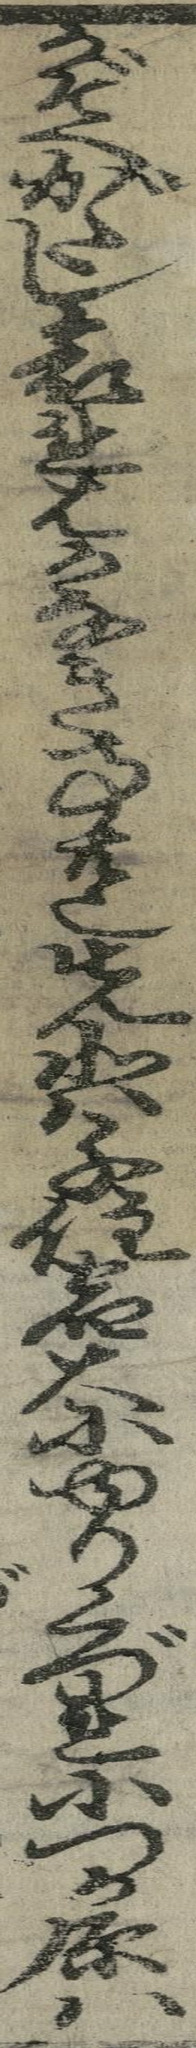かぞへがたし哀れはかなき事共也先北は千住宿大にゆりくづれ小つか原は
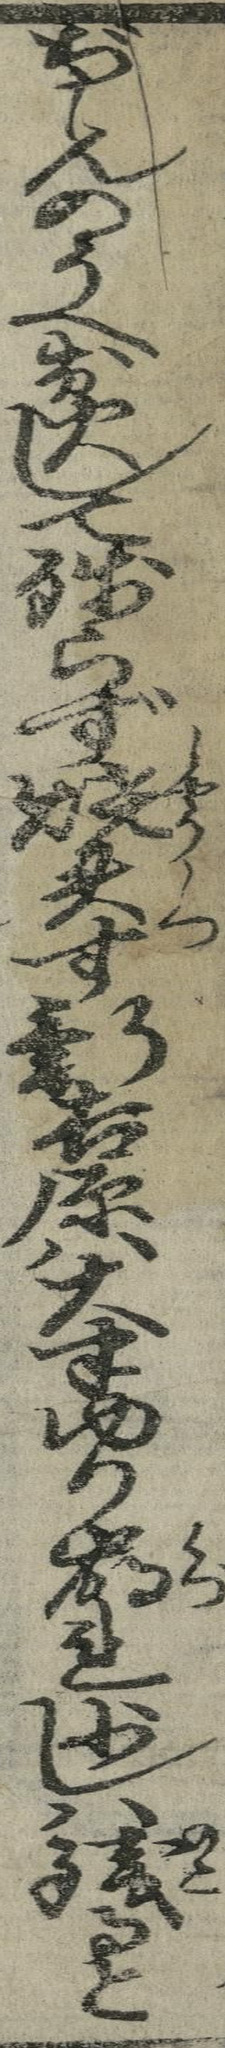ぢしんのうへ出火して残らず焼失す新吉原は大半ゆり崩れ少しは残ると
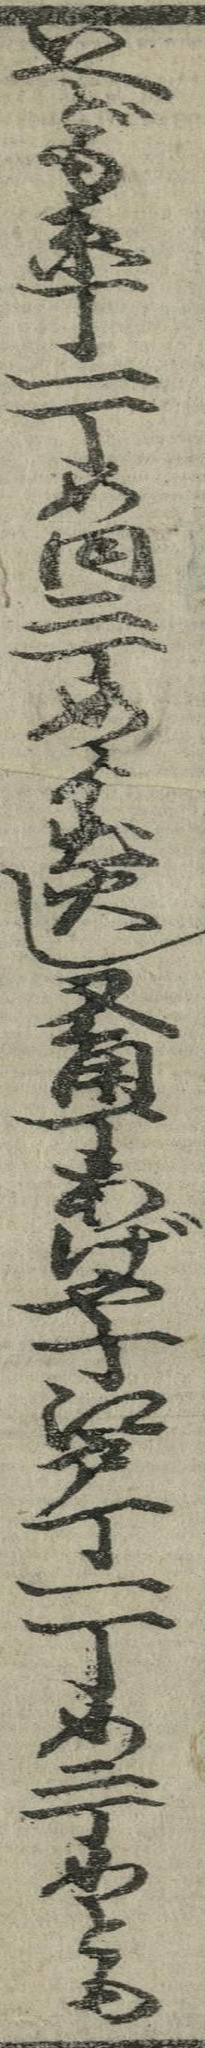いへども京丁一丁め同二丁めゟ出火し又角丁あげや丁江戸丁一丁め二丁めとも
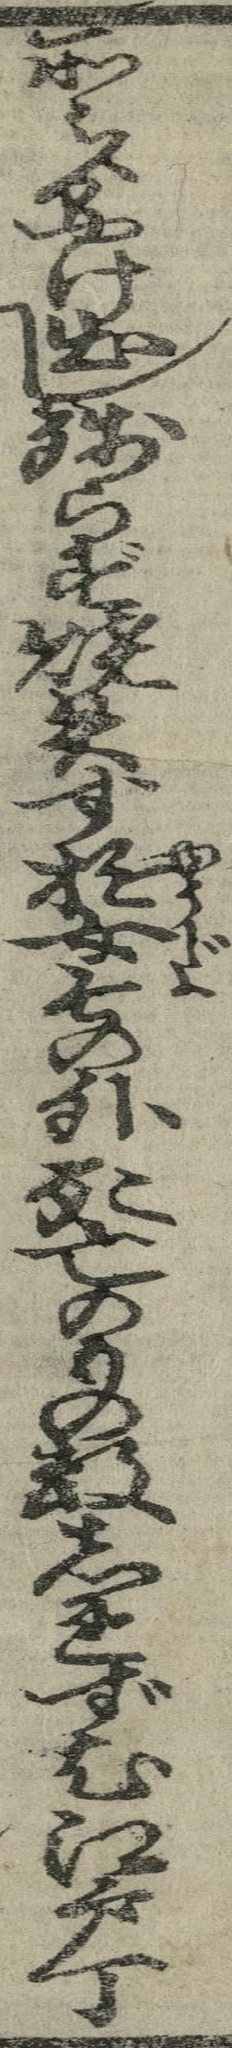所々ゟやけ出し残らず焼失す遊女その外死亡のもの数しれず尤江戸丁
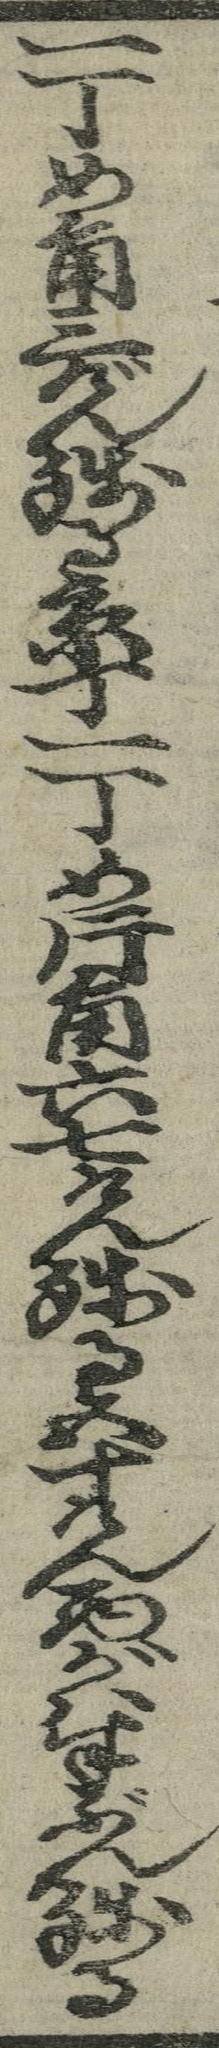一丁め角三げん残る京丁一丁め片角六七けん残る五十けん西がは半ぶん残る
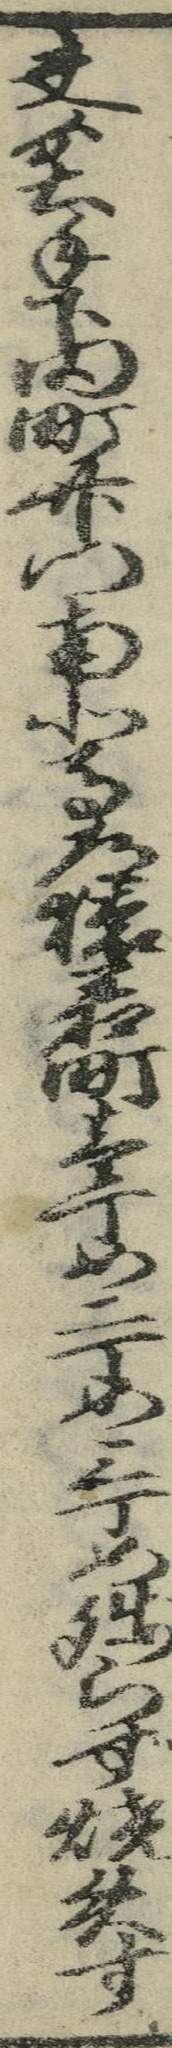夫ゟ土手下田町竹門南北馬道猿若町壱丁め二丁め三丁め残らず焼失す
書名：安政息災記　全
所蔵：東京大学地震研究所図書室 Earthquake Research Institute Library, The University of Tokyo, JAPAN
